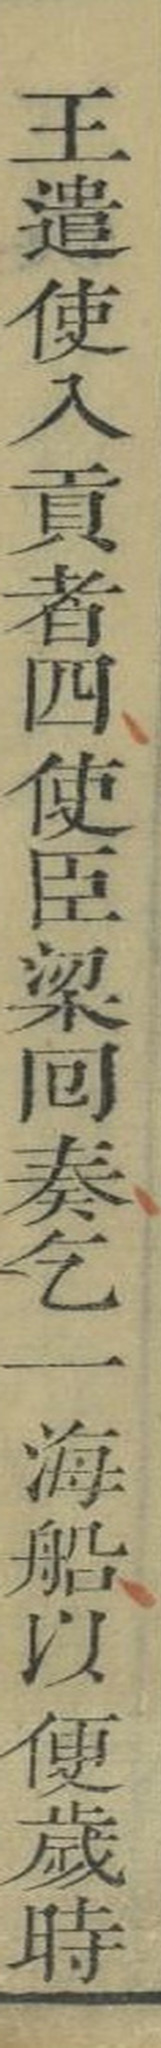王遣使入貢者四使臣梁回奏乞一海船以便歳時
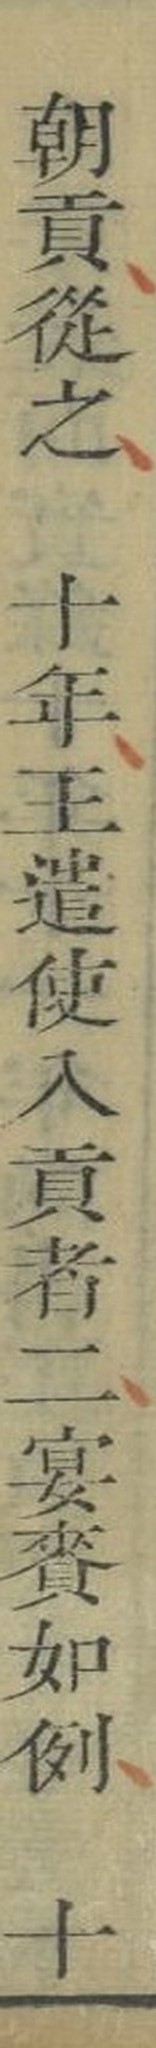朝貢従之十年王遣使入貢者二宴賚如例十
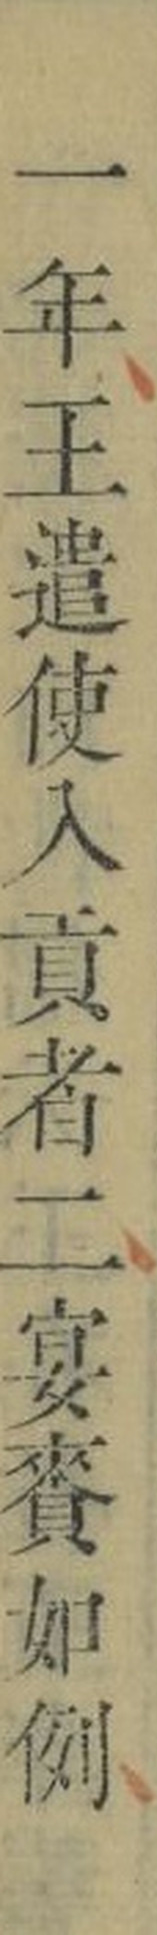一年王遣使入貢者二宴賚如例

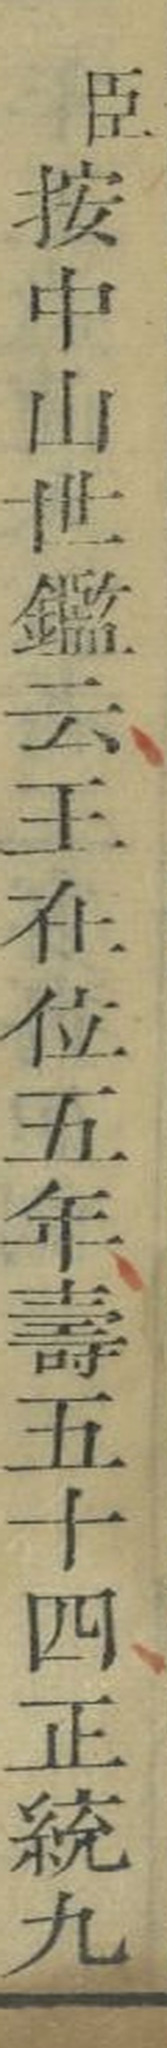臣按中山世鑑云王在位五年寿五十四正統九
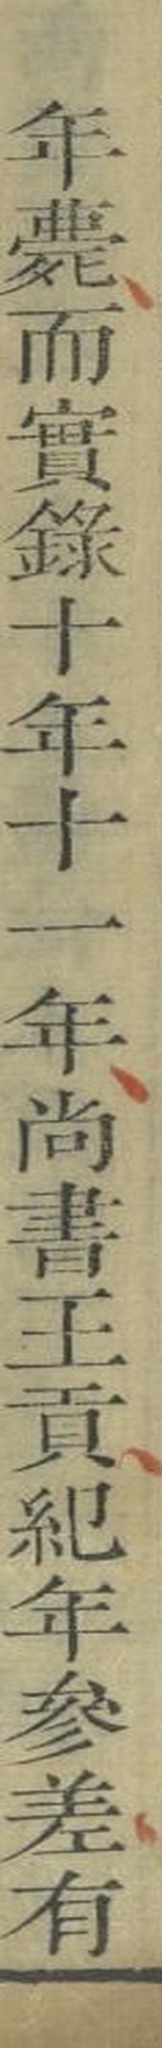年薨而実録十年十一年尚書王貢紀年参差有
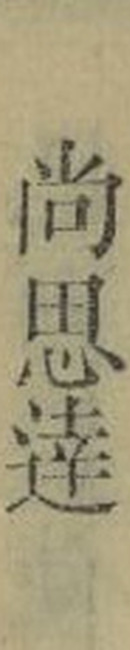尚思達
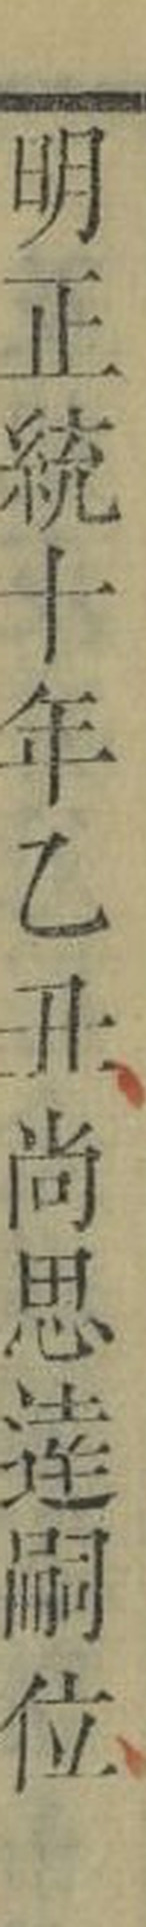明正統十年乙丑尚思達嗣位
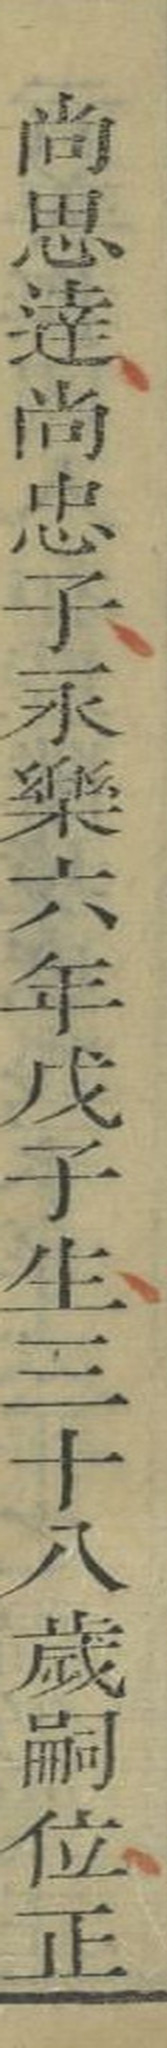尚思達尚忠子永楽六年戌子生三十八歳嗣位正
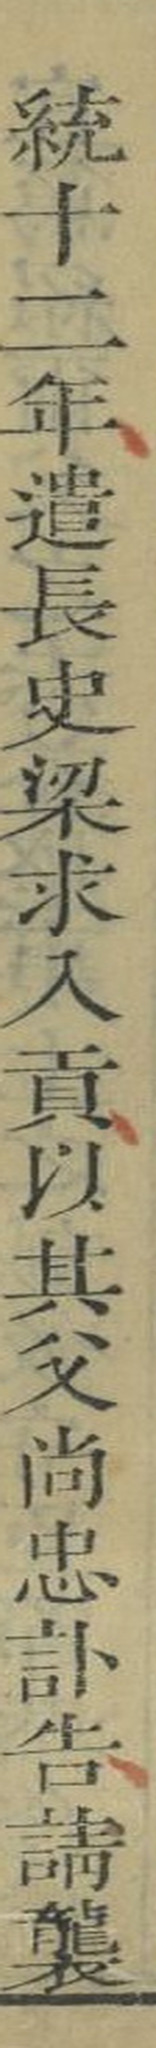統十二年遣長史梁求入貢以其父尚忠訃告請襲
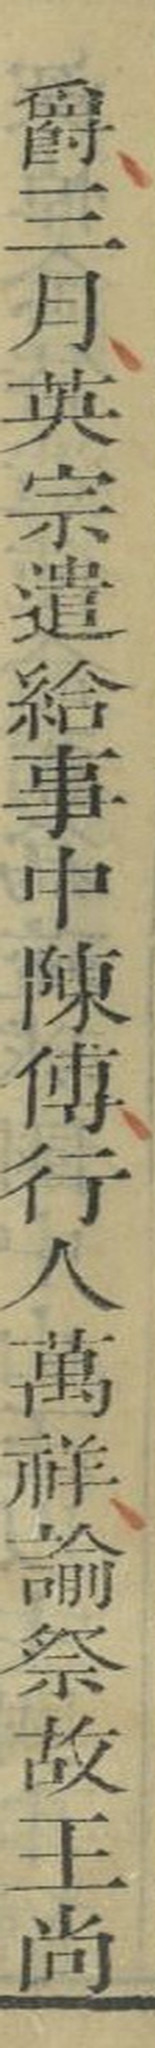爵三月英宗遣給事中陳傅行人万祥諭祭故王尚
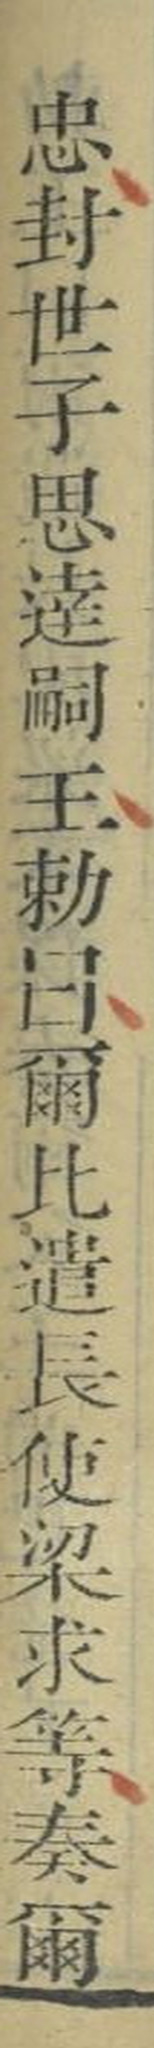忠封世子思達嗣王勅曰爾比遣長使梁求等奏爾
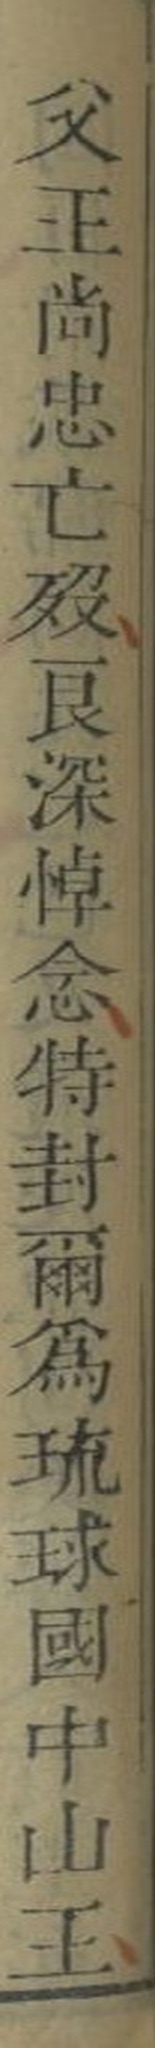父王尚忠亡歿良深悼念特封爾為琉球国中山王
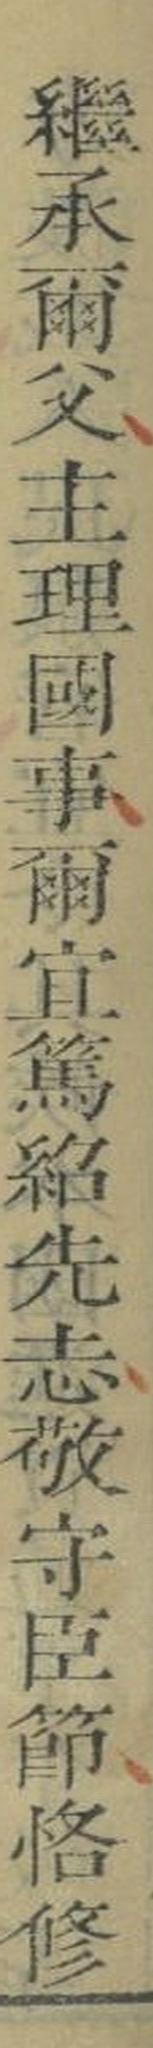継承爾父主理国事爾宜篤紹先志敬守臣節恪修
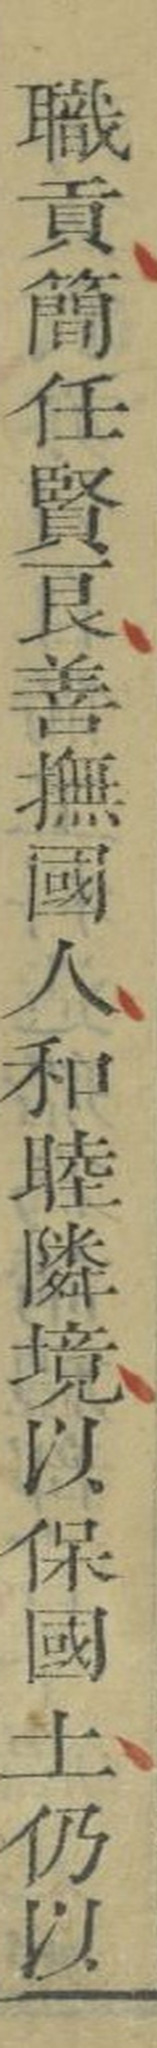職貢簡任賢良善撫国人和睦隣境以保国土仍以
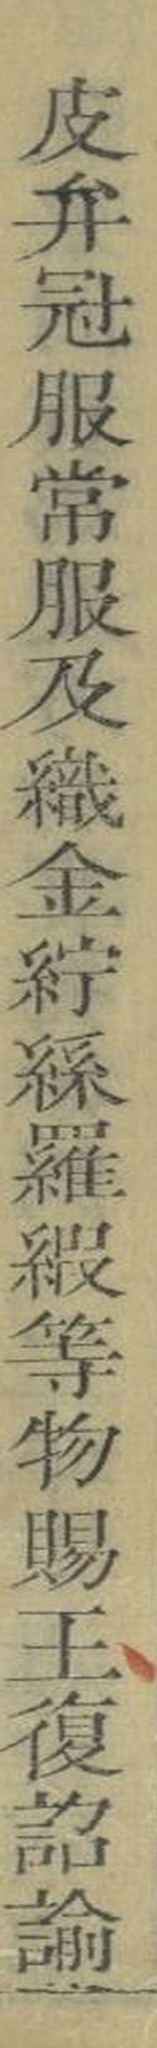皮弁冠服常服及織金紵糸羅緞等物賜王復詔諭
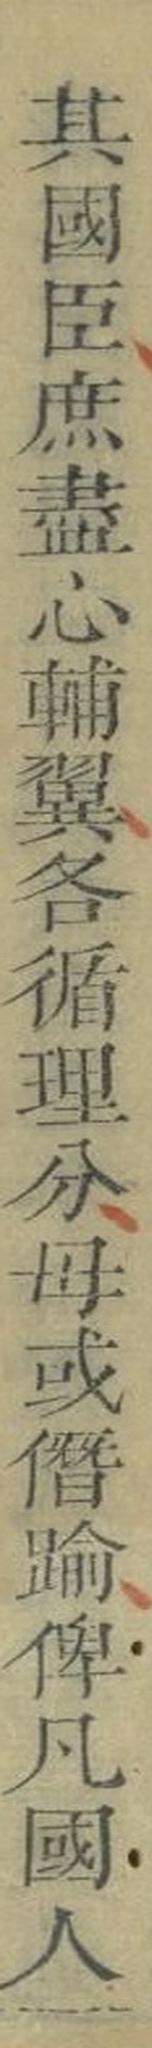其国臣庶尽心輔翼各循理分母或僭踰俾凡国人
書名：中山伝信録 巻三
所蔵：University of the Ryukyus Library
